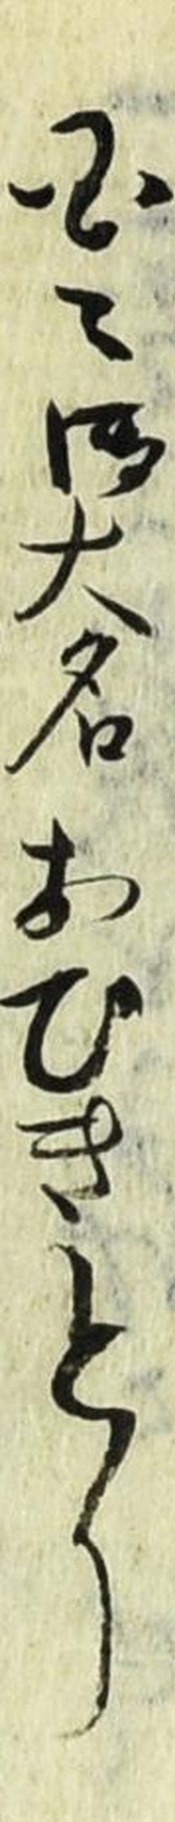国々御大名おひきとり
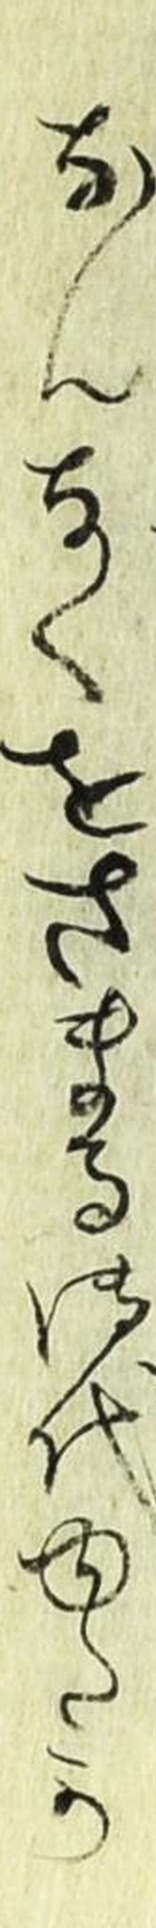なんなくをさまる御代ゆたか
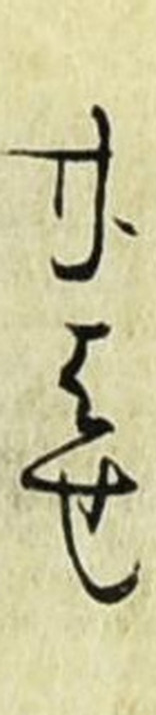廿とせ
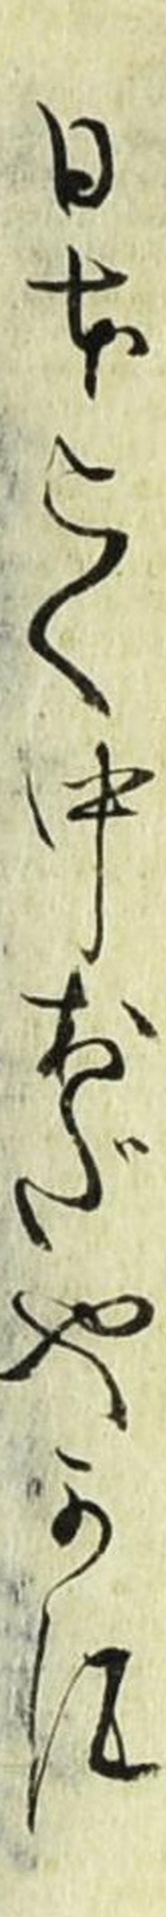日本こく中おだやかに
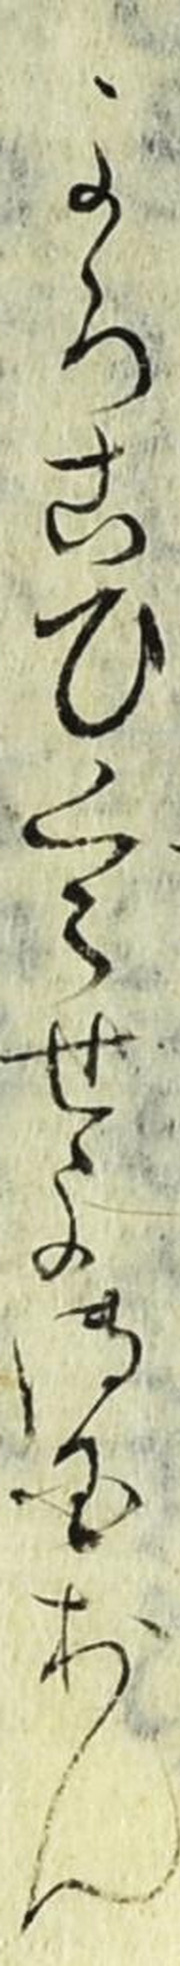よろこひくらせよ御国おん
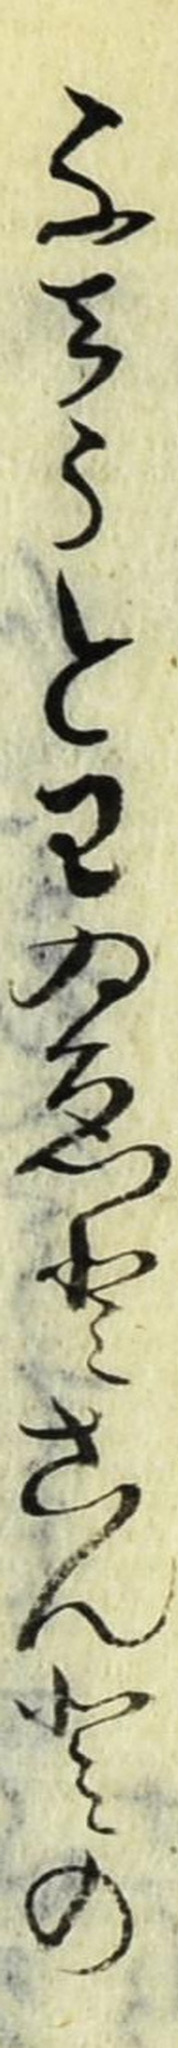ふはうとわゐゑとさんとの
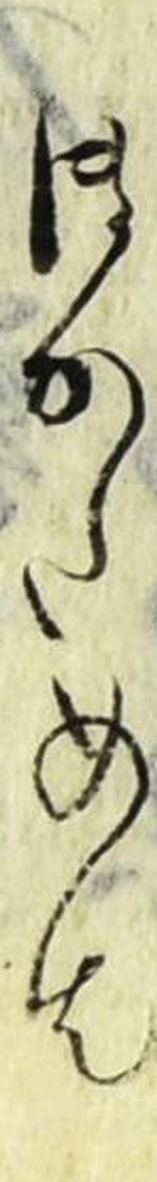御かためは
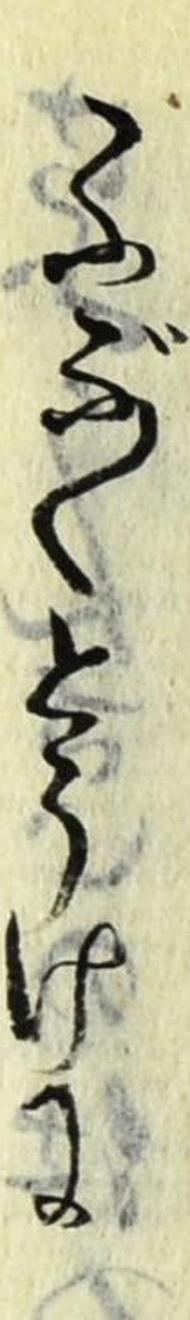ふぶくとうけに
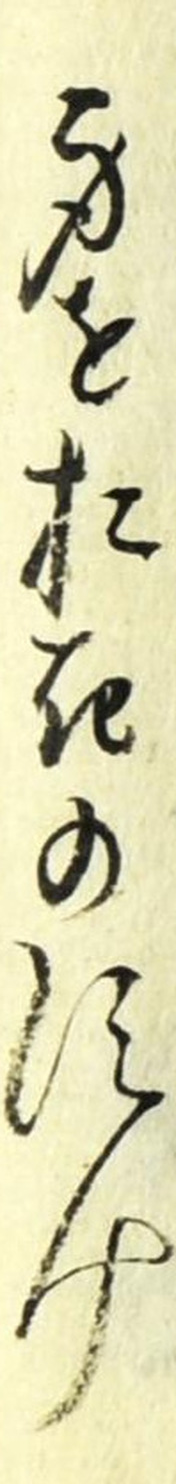身をおきのすけ

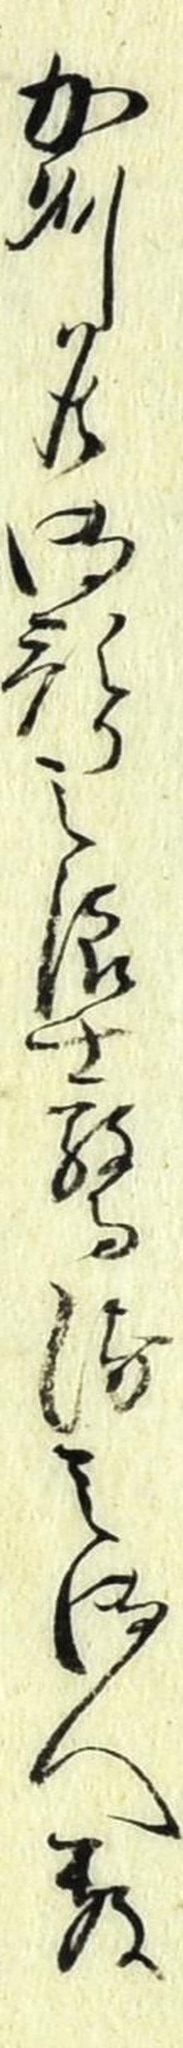加州侯御預り之浪士警衛之御人数
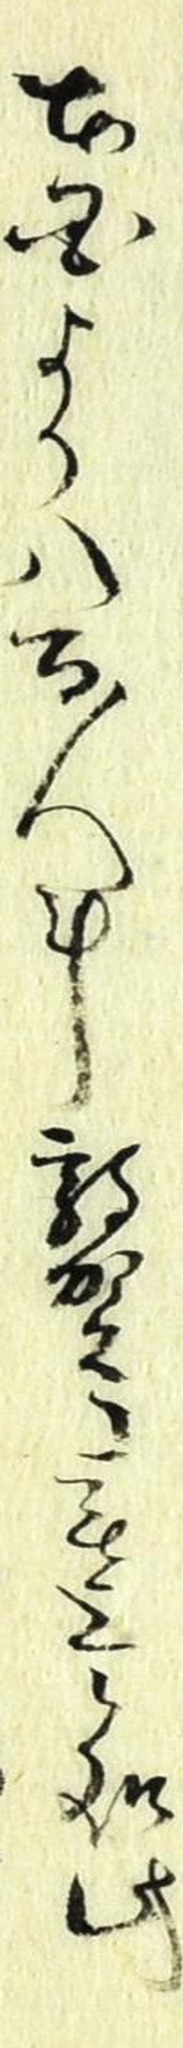本国より八百人計敦賀へ被上候処此
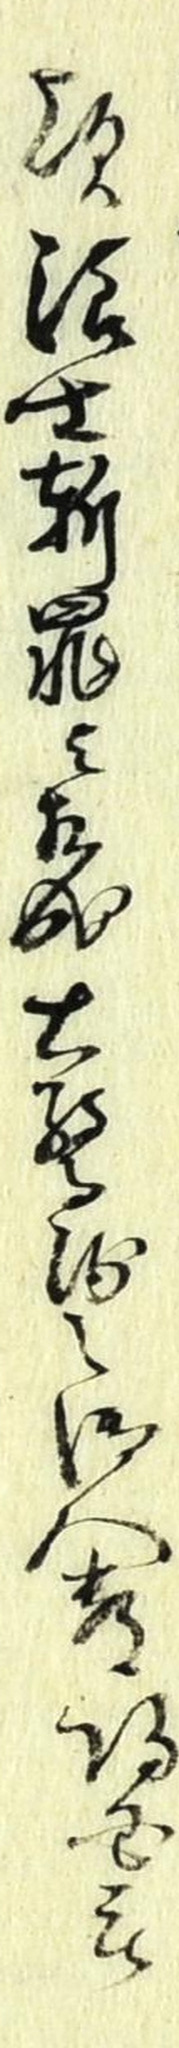頃浪士斬罪と相成右警衛之御人数帰国被
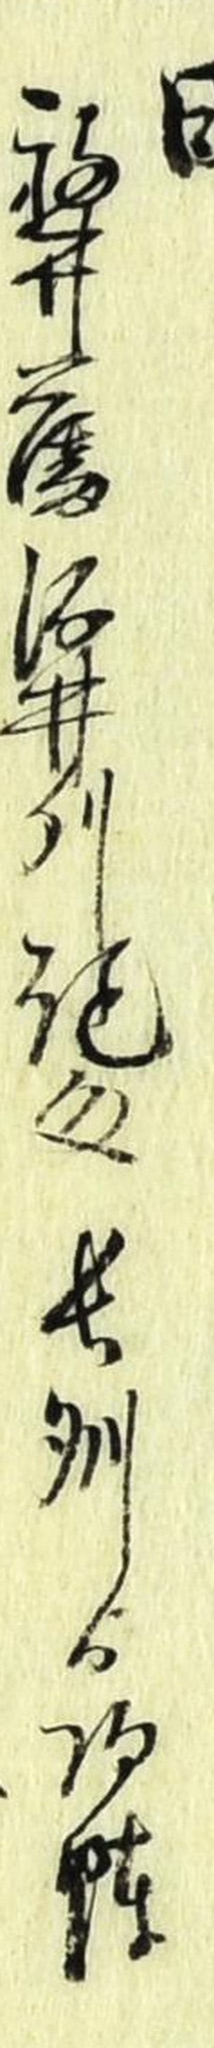福井藩酒井外記殿長州ゟ帰陣
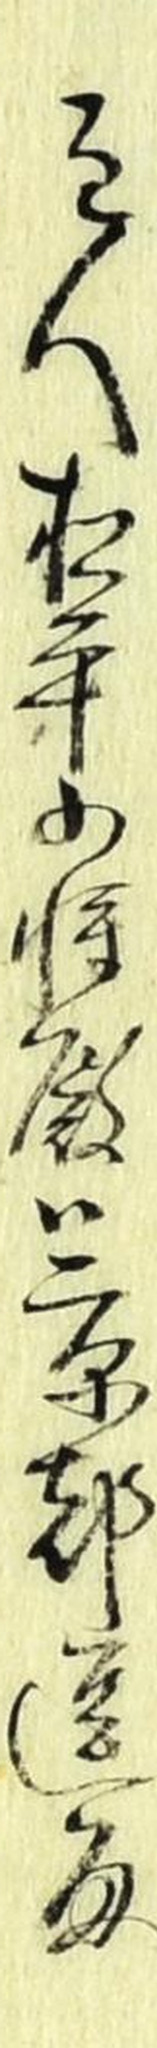主人松平少将殿は京都逗留
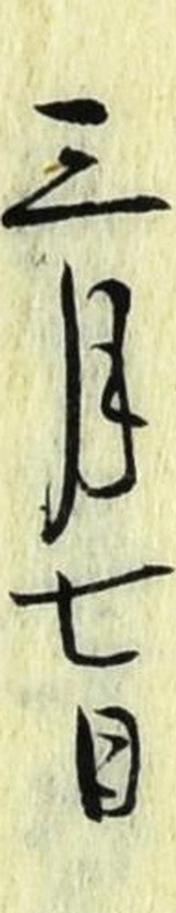三月七日
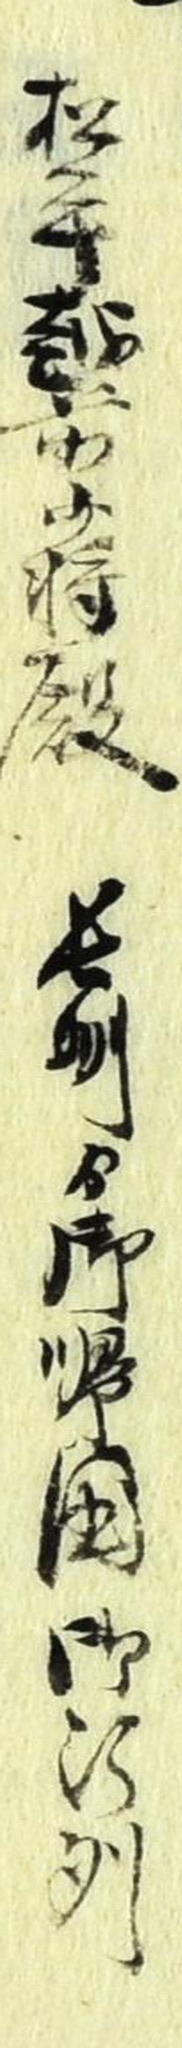松平越前少将殿長州より御帰国御行列
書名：（日記）
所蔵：福井県文書館 Fukui Prefectural Archives
